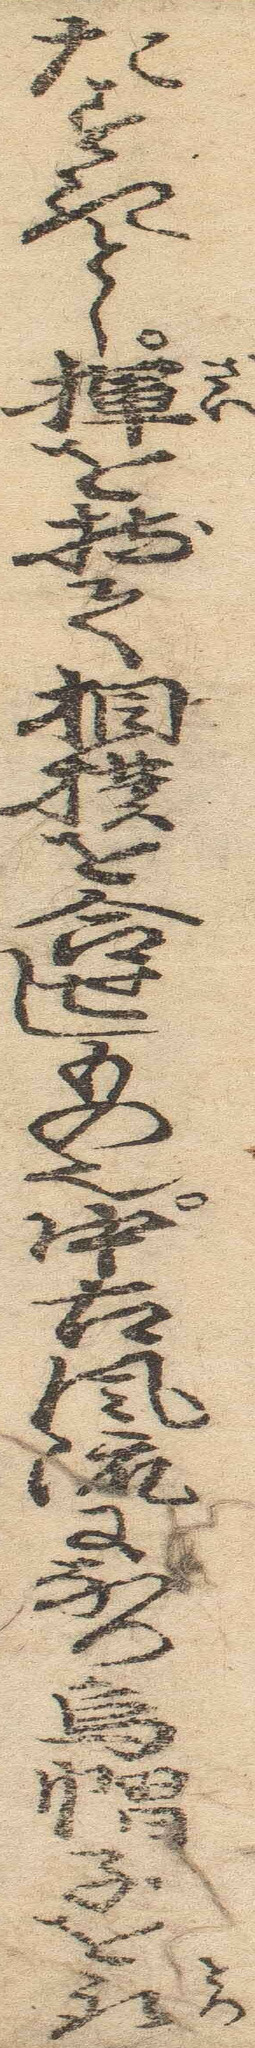たすきとし。揮を持て相撲を合せしもの也。中古風流になり烏帽子を取
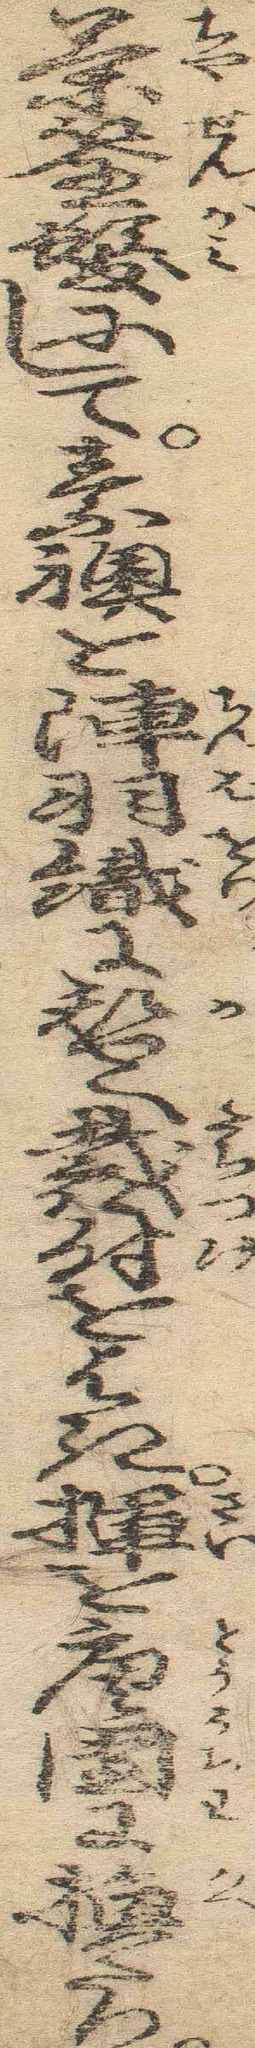茶筌髪にして。素襖と陣羽織に替へ裁付をはき。揮を唐団に換たり。
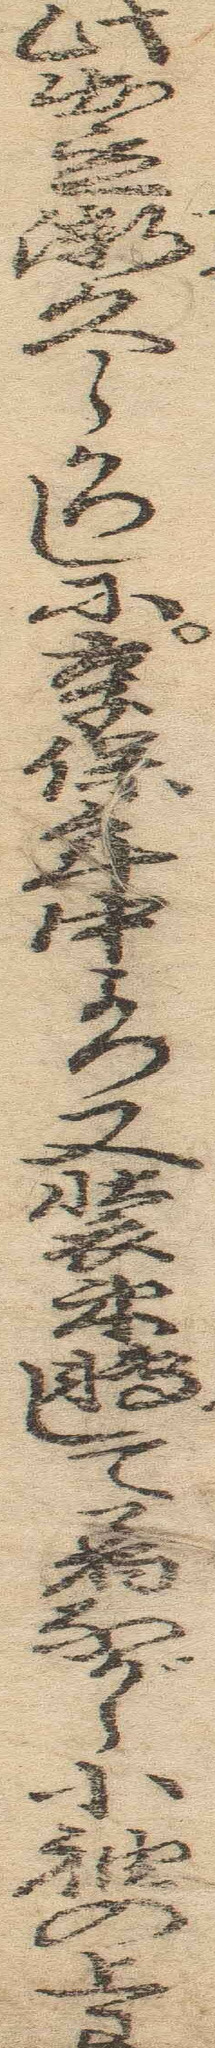此出立漸久しかりしに。享保年中より又装束転して着ながし小袖の上に
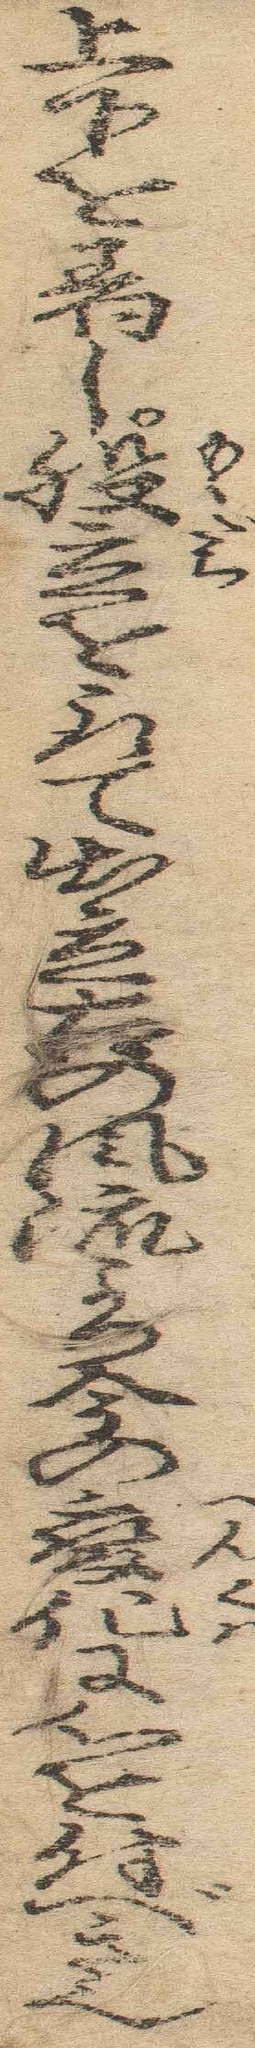上下を着し。股立を取て出立右の風流より今の変化に心を付べき也

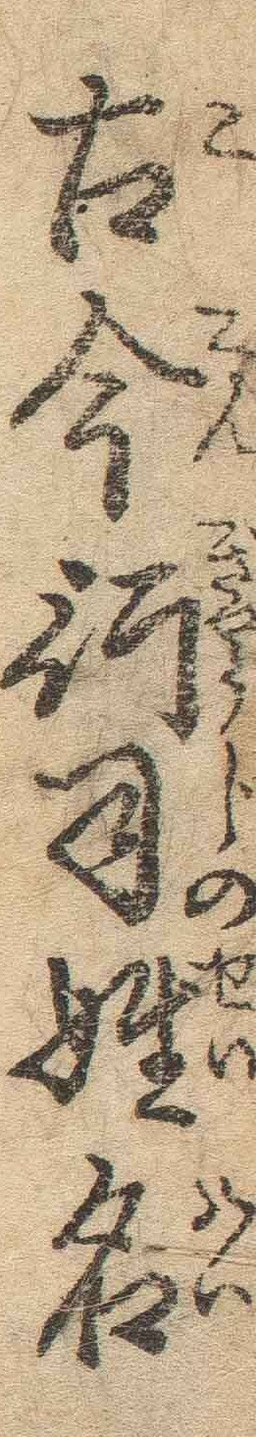古今行司姓名
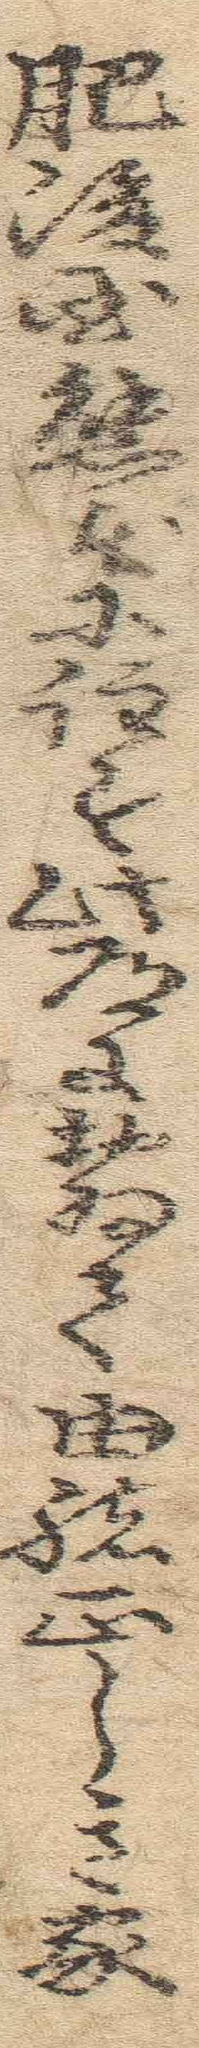肥後国熊本に住す此道におゐて由緒正しき家
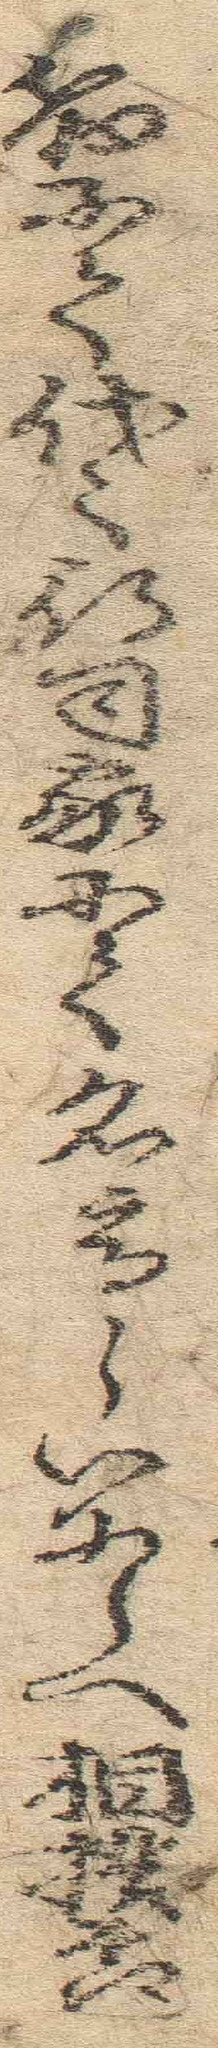筋にて代々行司家にて名髙しいにしへ相撲節
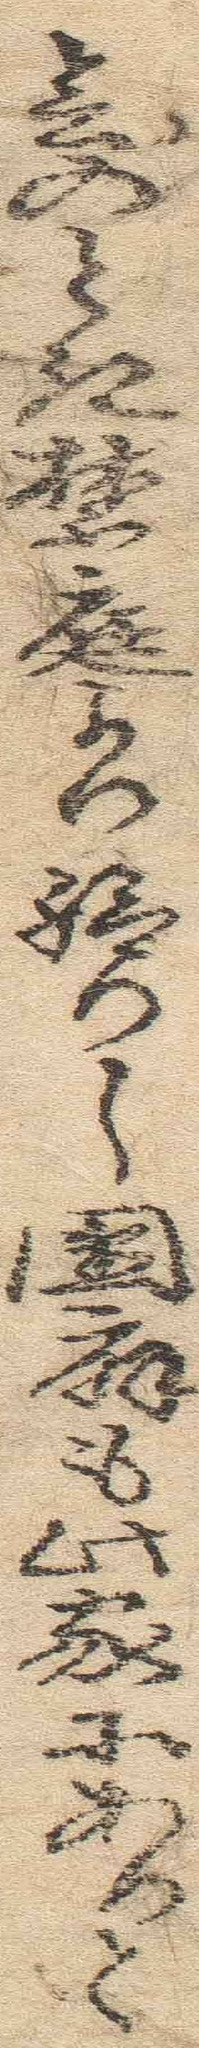会のとき禁庭より賜りし団扇も此家にありと
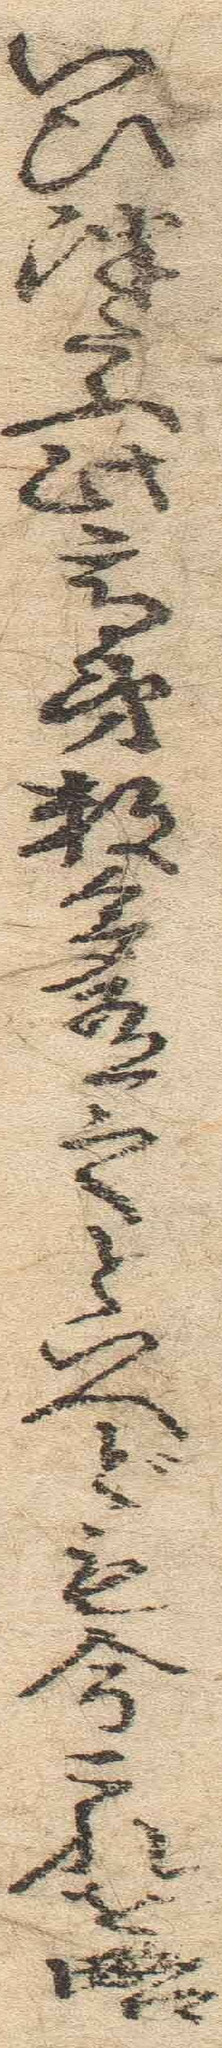いひつたふ此高弟数多有之といへども今これを略
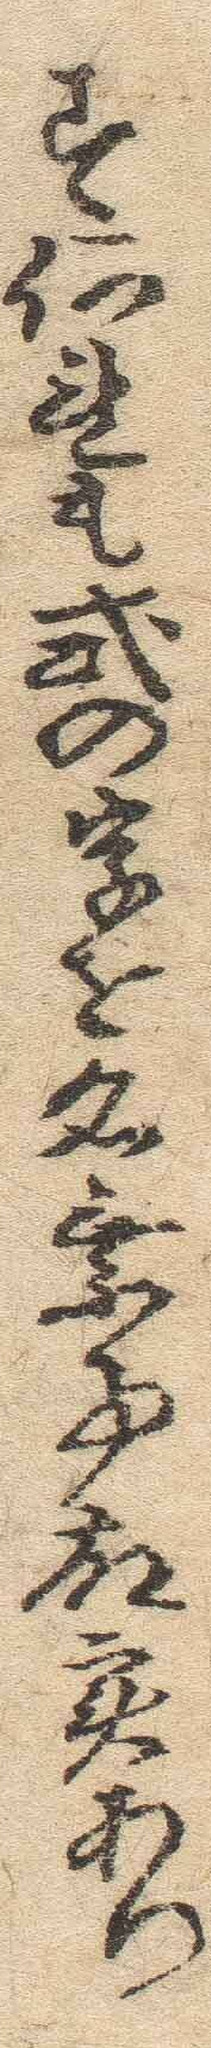す何れも式の字を名乗事故実あり
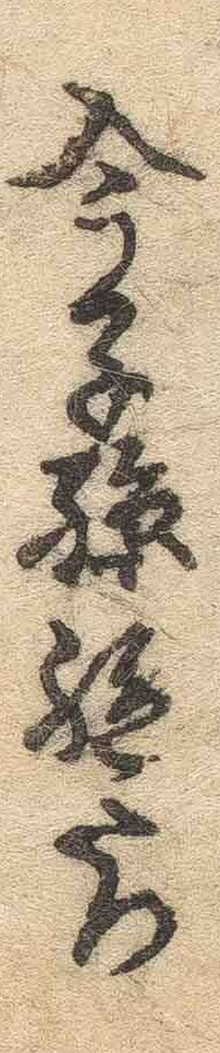今子孫絶たり
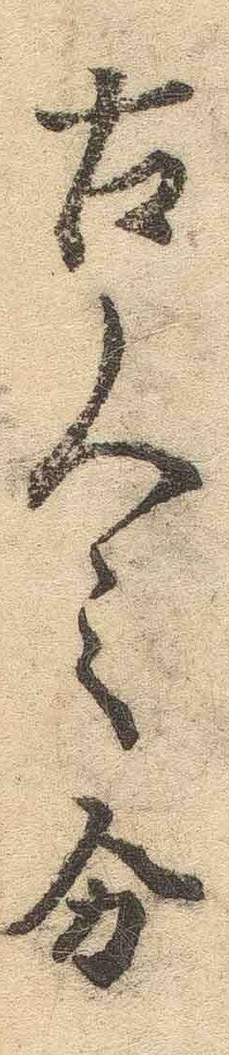右人之分
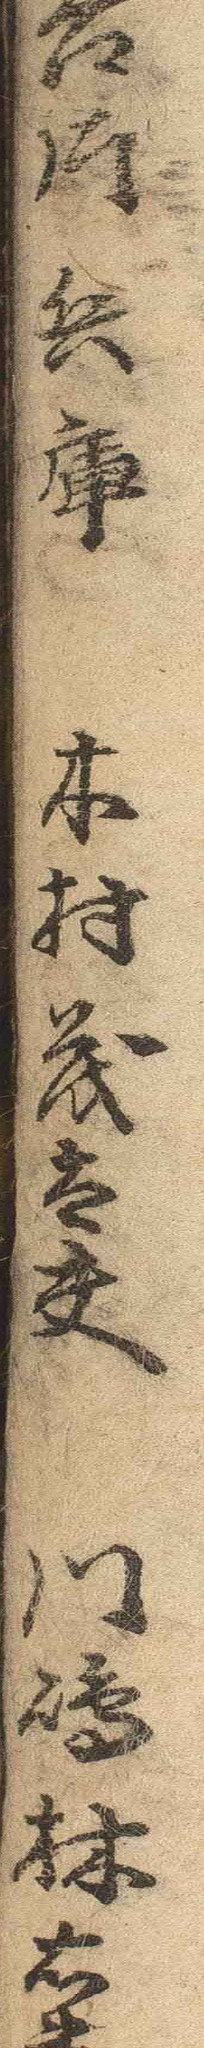吉川兵庫木村茂太夫川嶋林右衛門
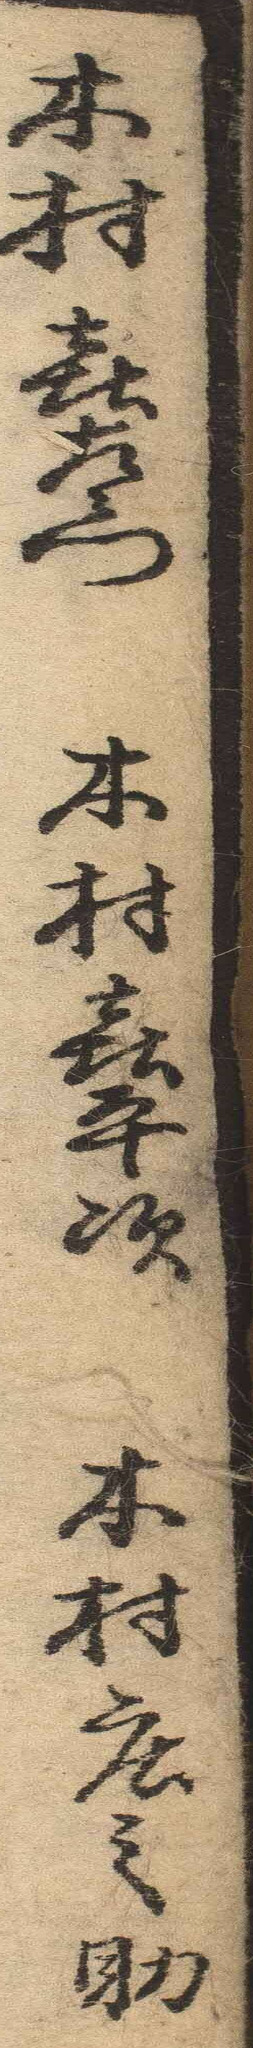木村喜左衛門木村喜平次木村庄之助
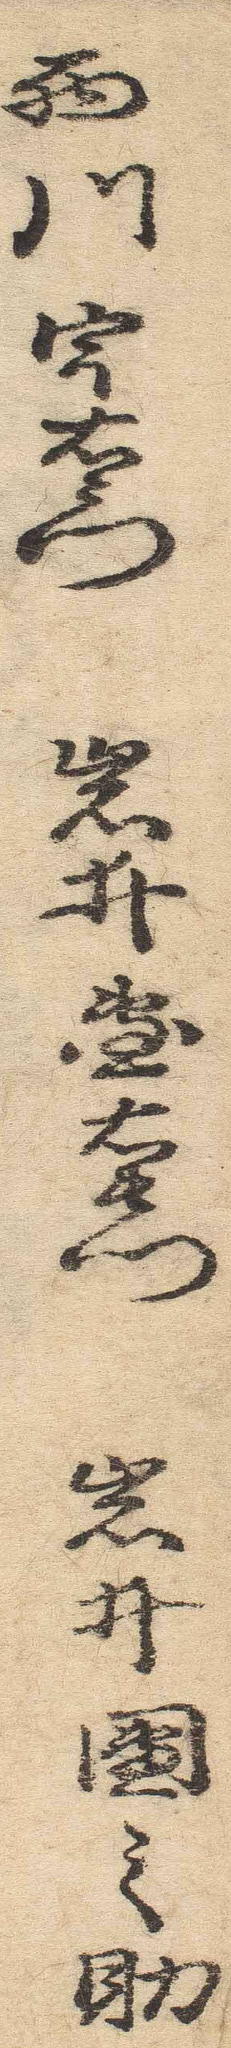西川宇右衛門岩井団右衛門岩井団之助
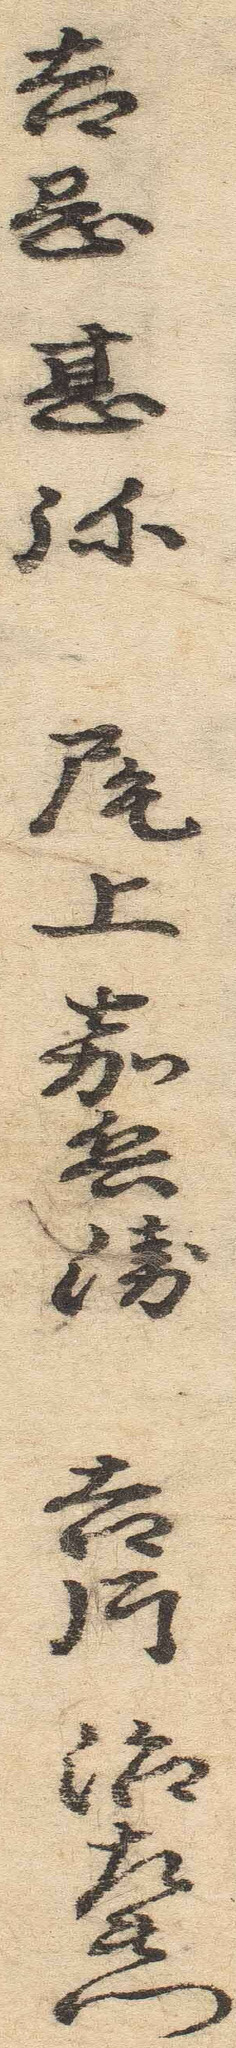吉岡甚弥尾上嘉兵衛吉川治左衛門
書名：古今相撲大全
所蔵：東京学芸大学附属図書館 国文学研究資料館
